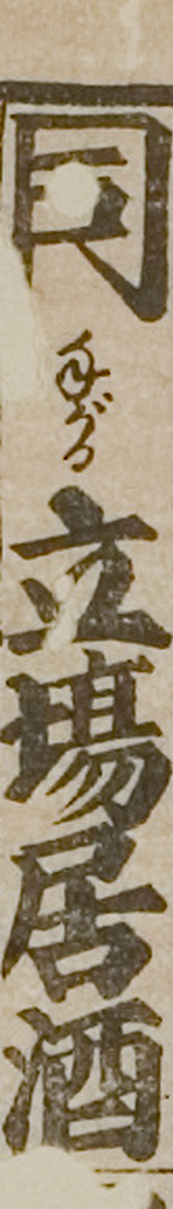同手がる立場居酒
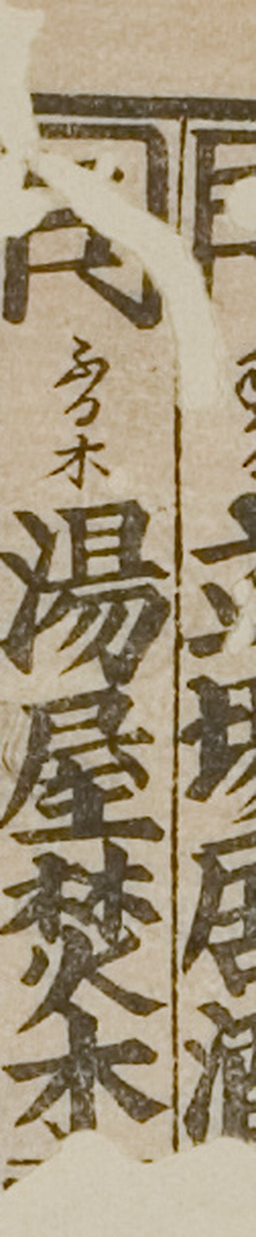同ふる木湯屋焚木
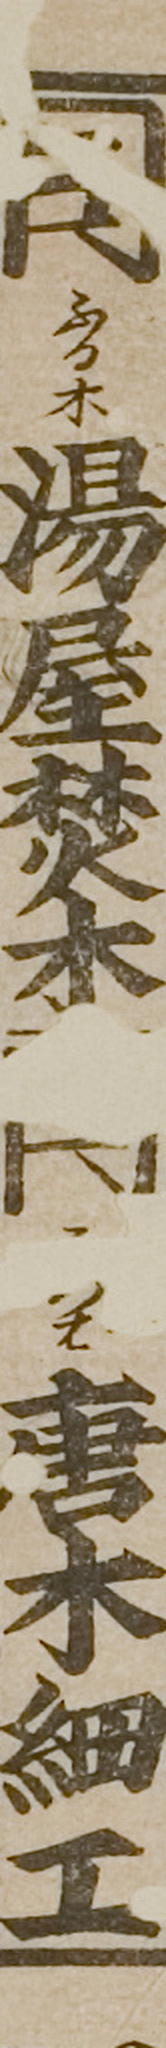同ふる木湯屋焚木
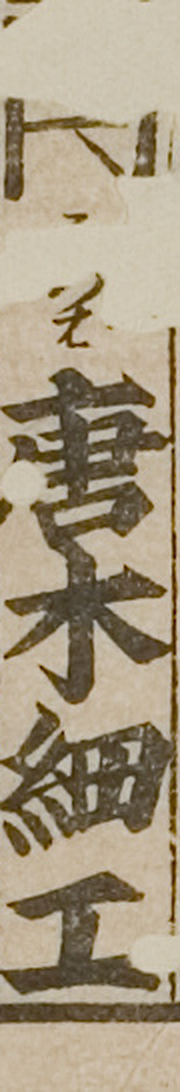同こつぱ唐木細工
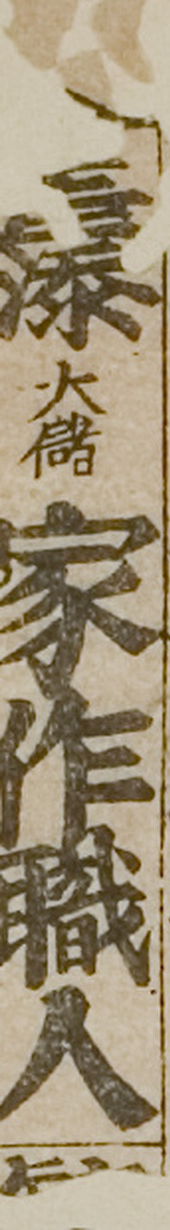差添大儲家作職人
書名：安政二年十月二日地震出火後日角力
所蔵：東京大学総合図書館 General Library in the University of Tokyo, JAPAN
